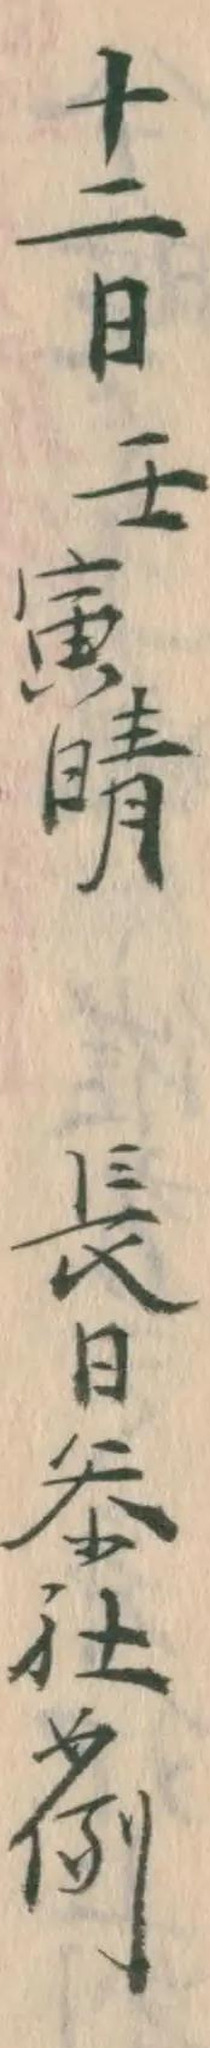十二日壬寅晴長日参社如例
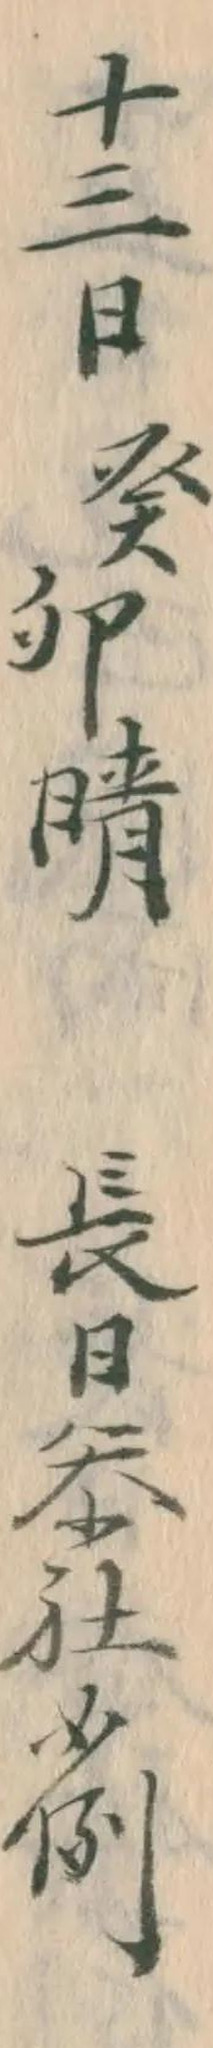十二日壬寅晴長日参社如例
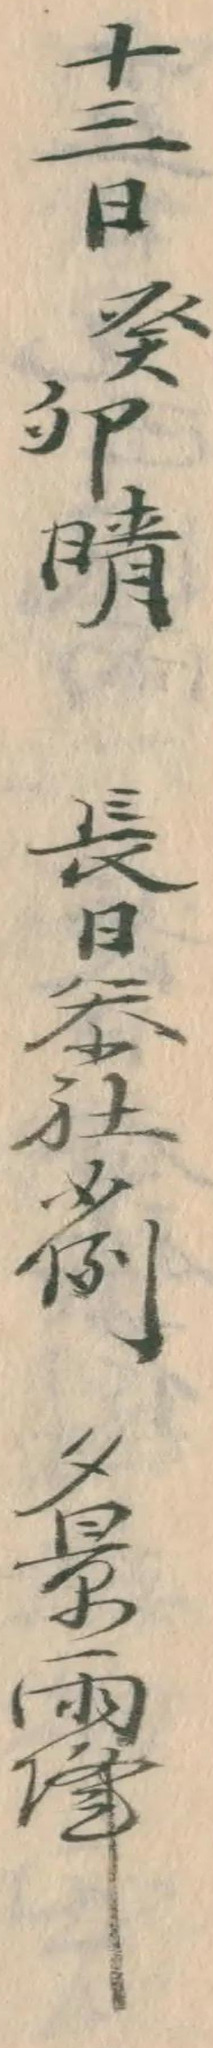十三日癸卯晴長日参社如例夕景雨降
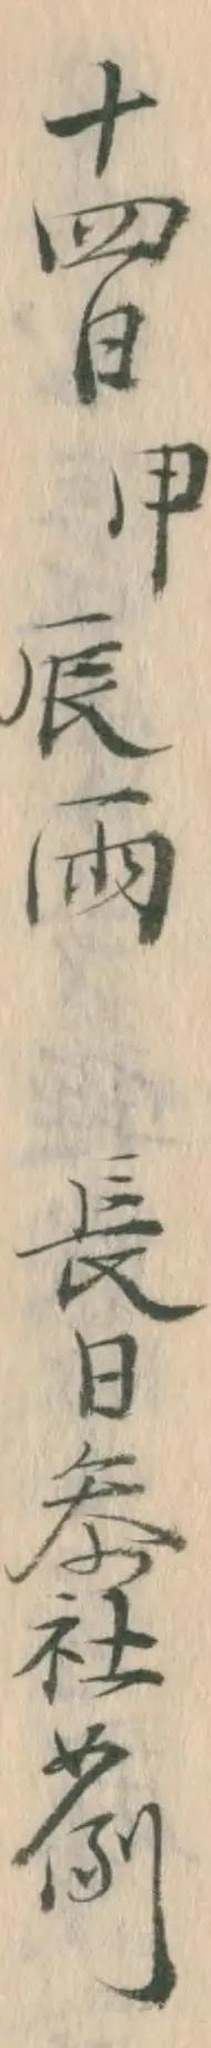十四日甲辰雨長日参社如例
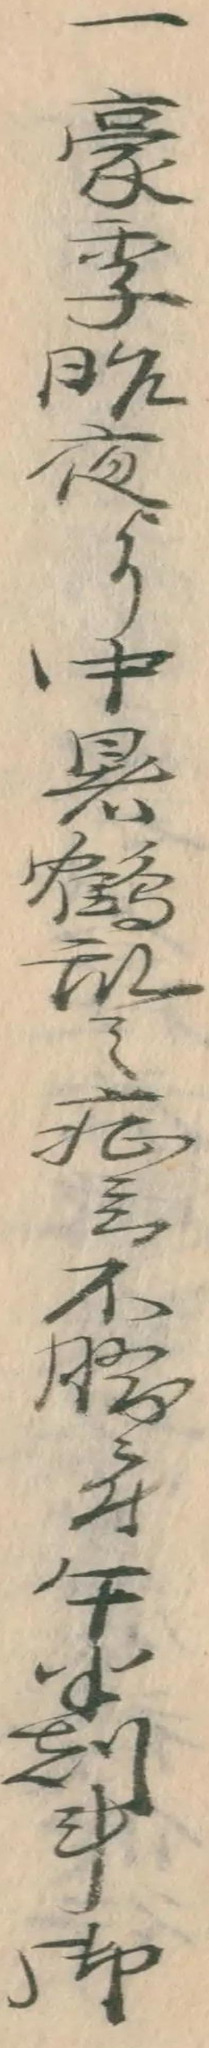一豪季昨夜より中暑鶴乱之症ニ而不勝ニ付午半刻斗御

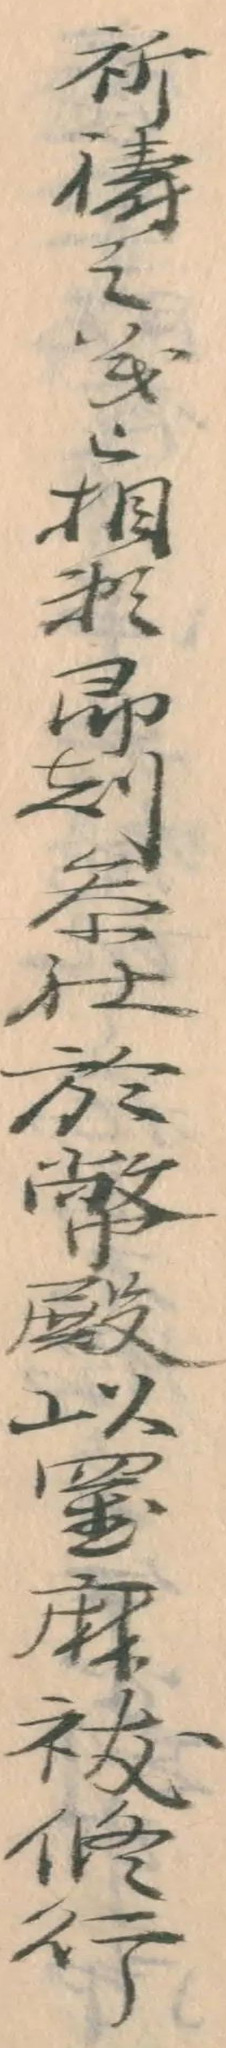祈祷之義被相頼即刻参社於幣殿以置麻祓修行
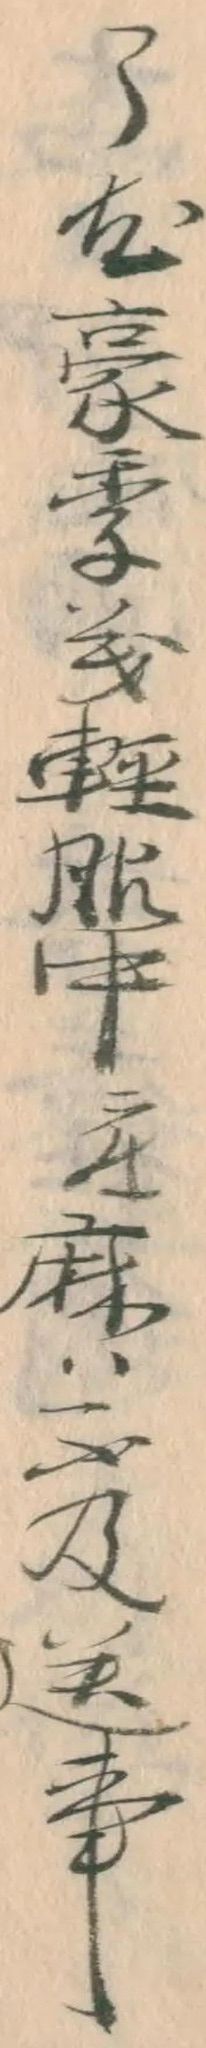了尤豪季義軽服中ニ付麻ハ不及送事
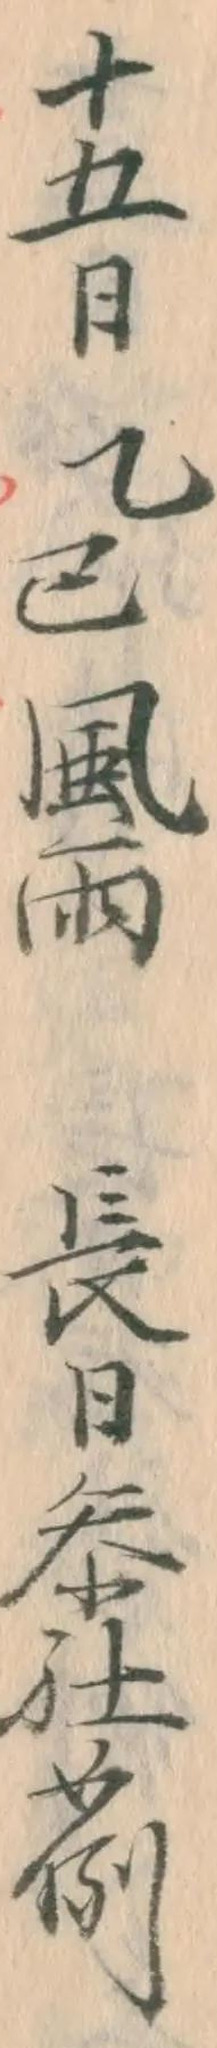十五日乙巳風雨長日参社如例
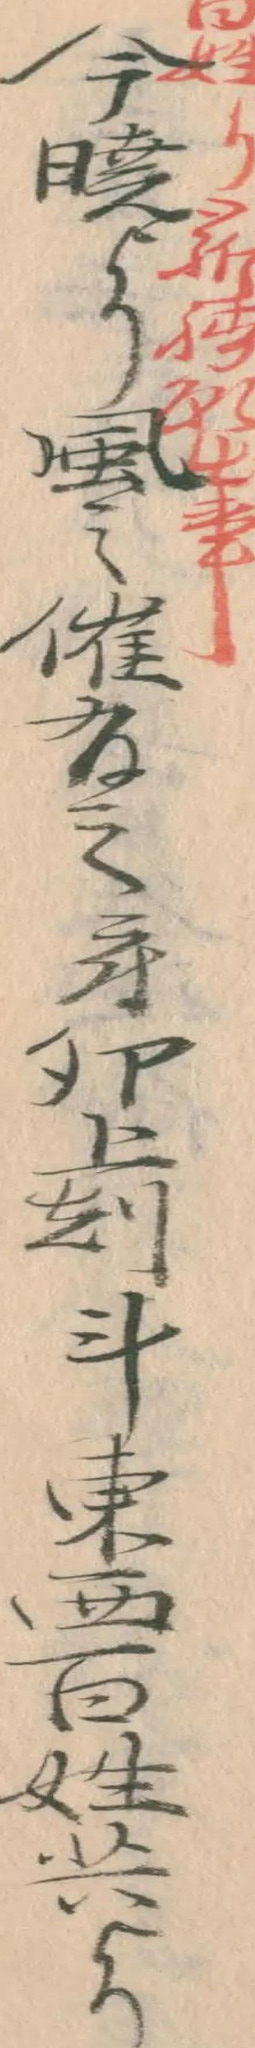一今暁より風之催有之ニ付卯上刻斗東西百姓共より
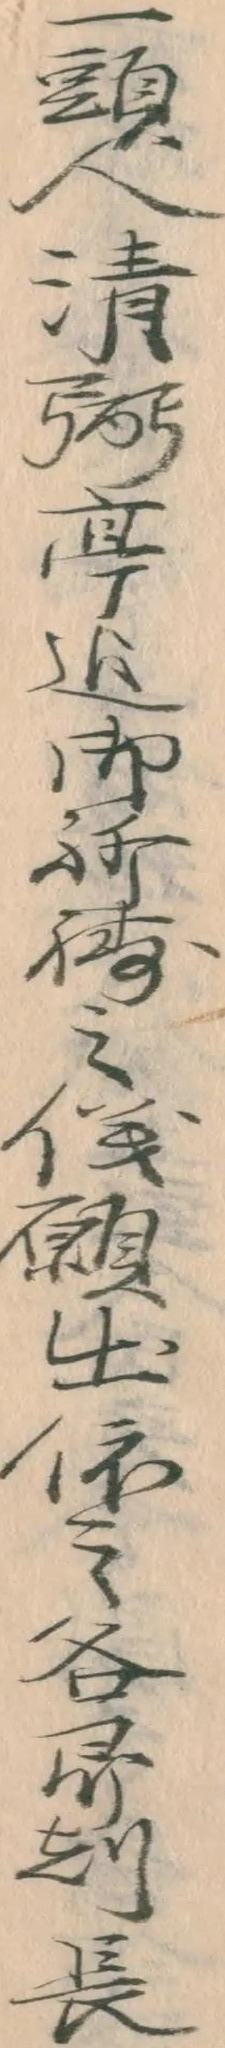一頭人清弼亭迄御祈祷之儀願出依之各即刻長
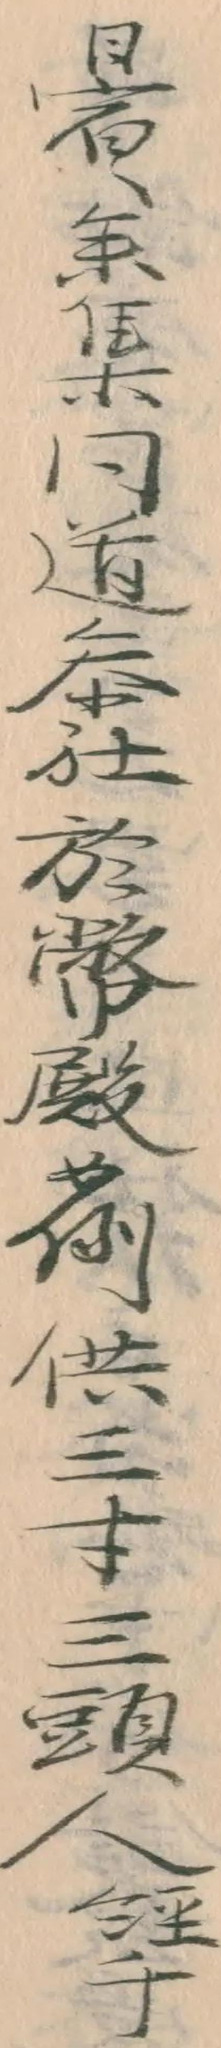日宿へ参集同道参社於幣殿如例供三寸三頭人経千
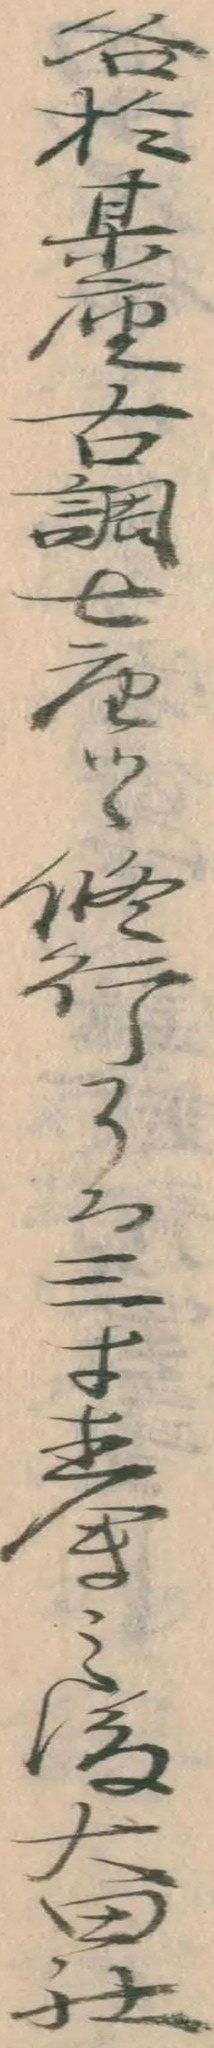各於某座古調七座ツヽ修行了而三寸直會之後大田社
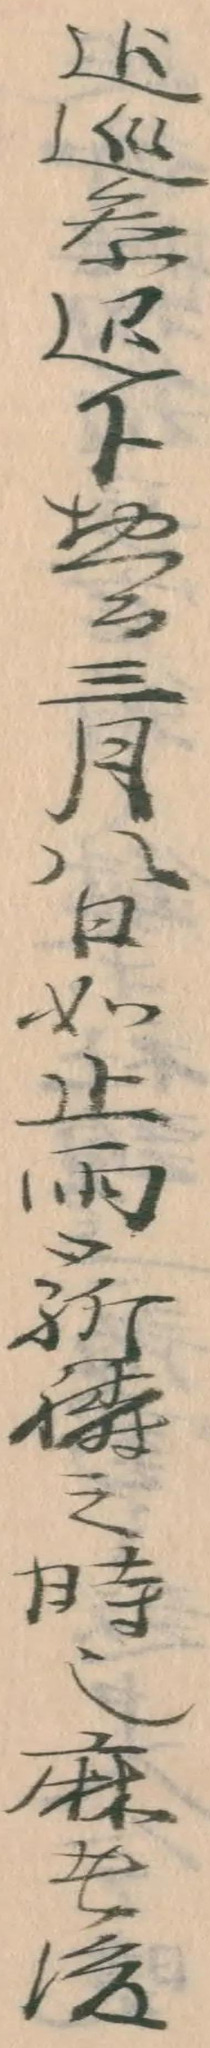迄巡参退下惣而三月八日如止雨御祈祷之時也麻張後
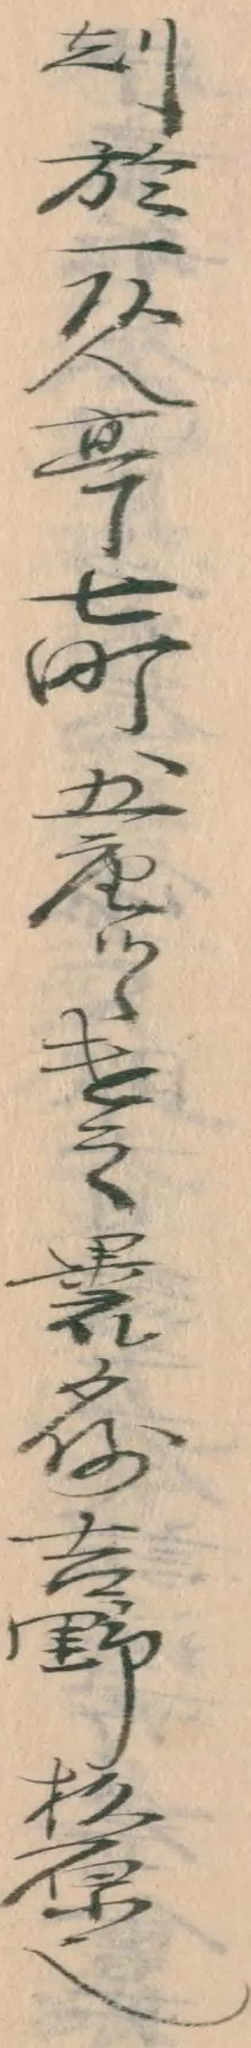刻於一頭人亭七町へ五座ツヽ遣之褁如例吉野杉原也
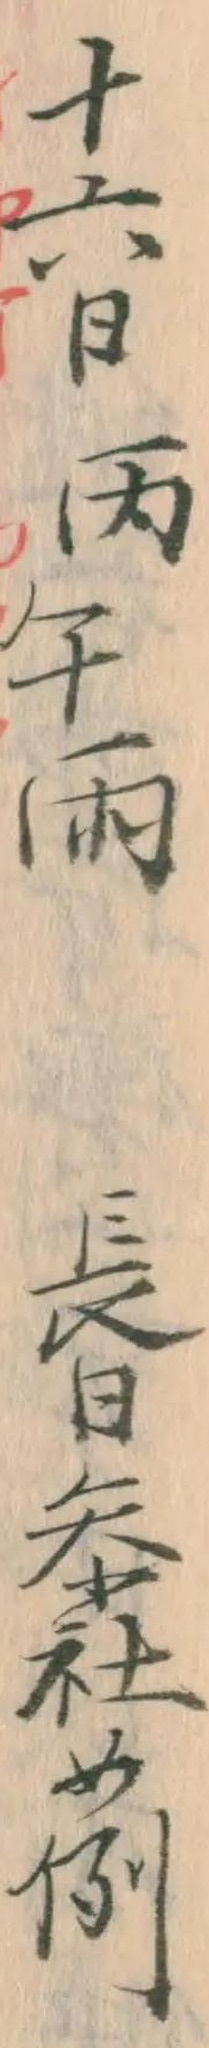十六日丙子雨長日参社如例
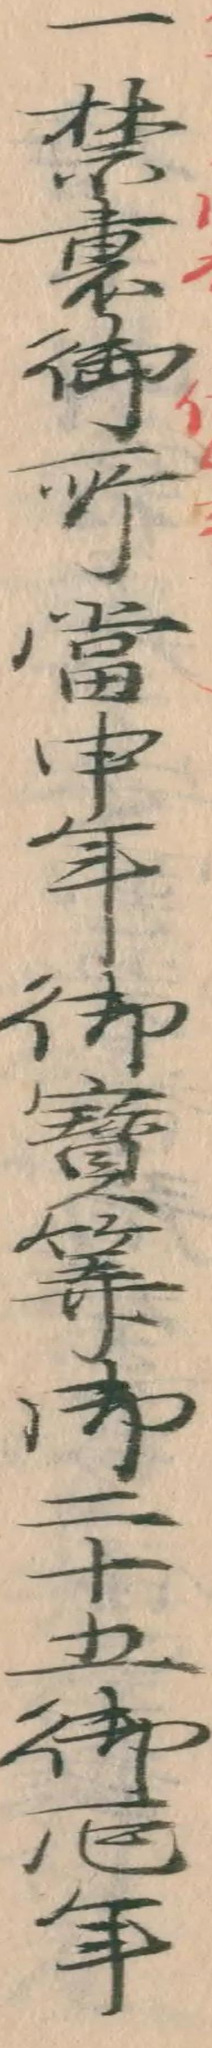一禁裏御所當申年御宝寶筭御二十五御厄年
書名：賀茂社記録. 第73冊
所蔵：国立国会図書館 National Diet Library, JAPAN
